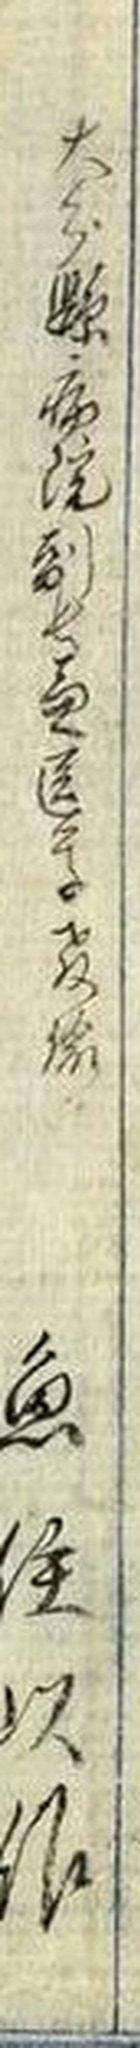大分県病院副長兼医学教諭魚住以作
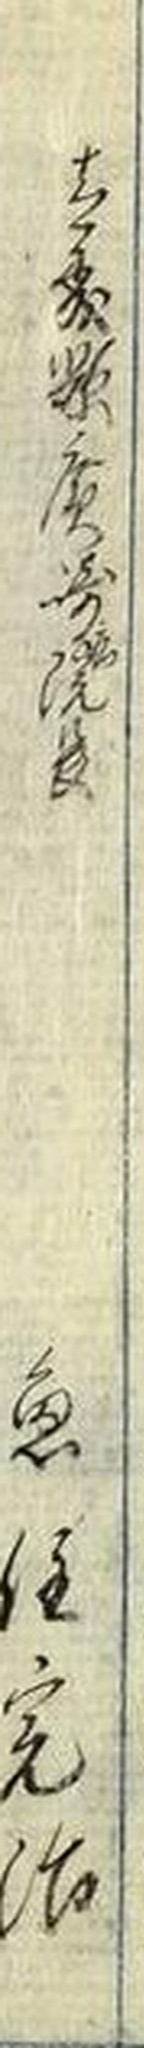青森県広崎病院長魚住完治
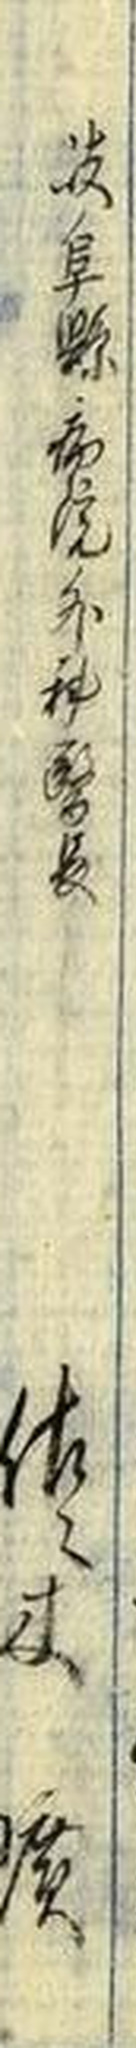岐阜県病院外科医長佐々木曠

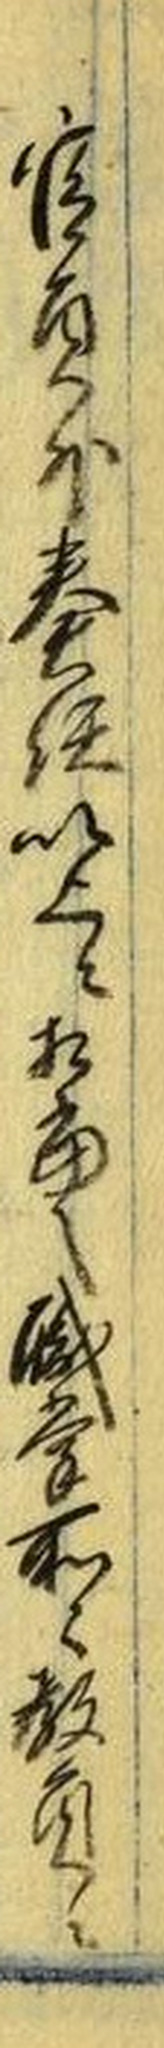官員外奏任以上ニ相当之職掌所々教員ニ
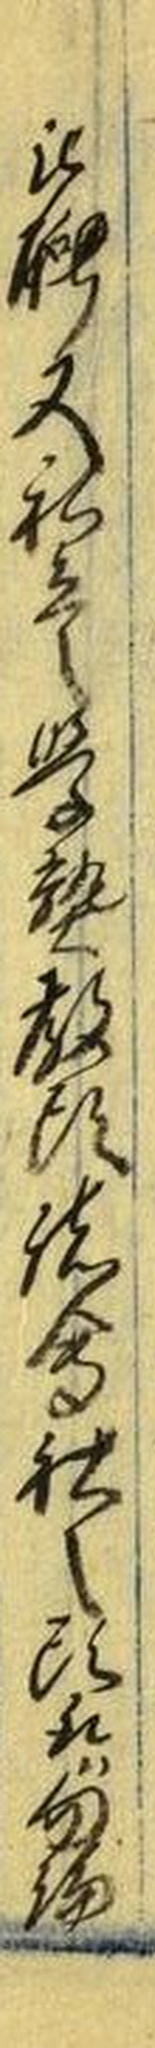被聘又私立之学塾教頭諸会社之頭取ハ勿論
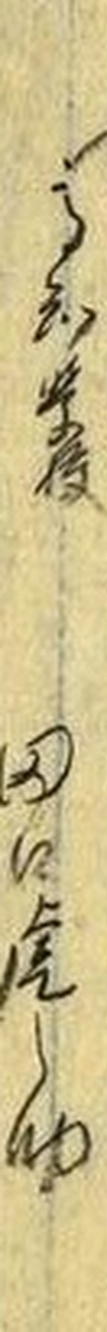高知学校田口虎之助

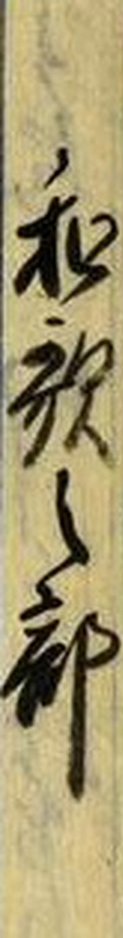和歌之部
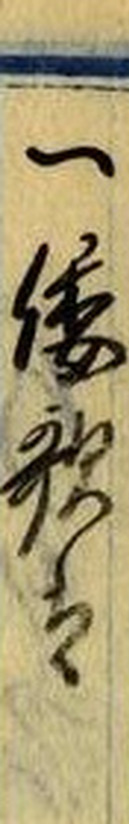一倭歌は
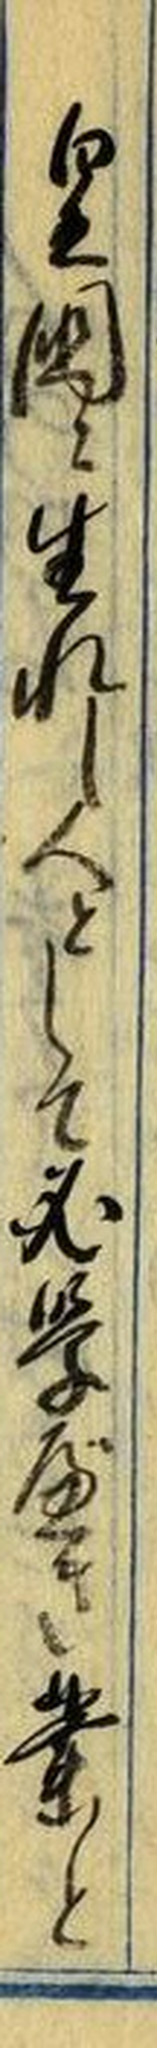皇国ニ生れし人として必学べき業と
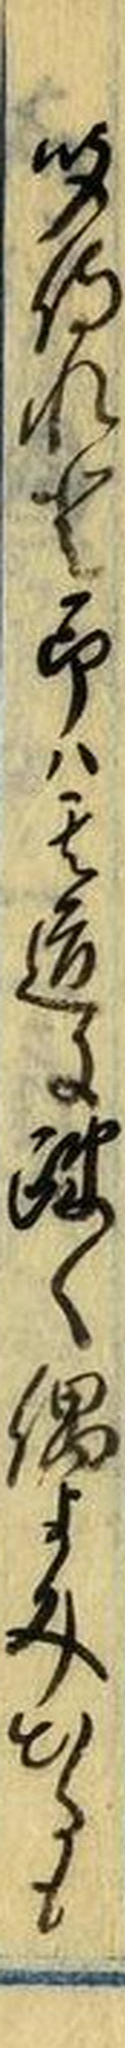聞侍れと予ハ其道に疎く偶よみ出るも
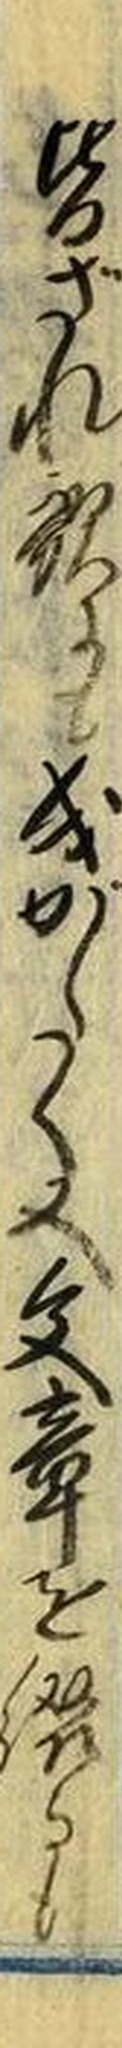皆ざれ歌にも成がたく又文章を綴るも
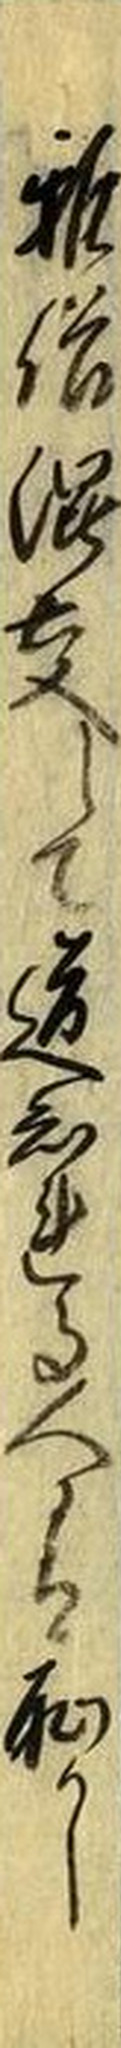雅俗混交して道知れる人ニは恥かし
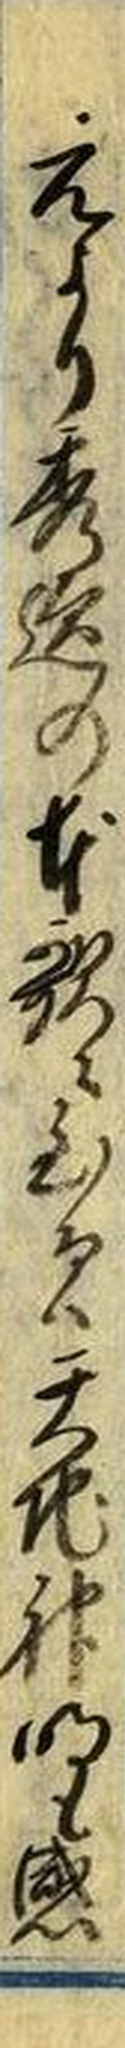元より秀逸の本歌ニ至而ハ天地神明も感
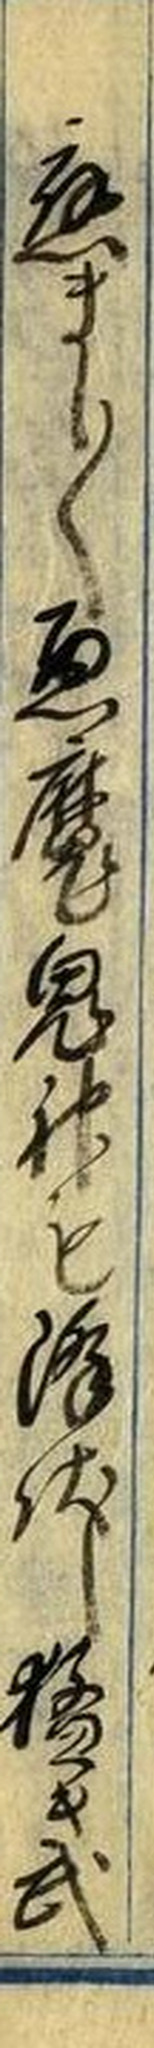応まし〳〵悪魔鬼神も降伏し猛キ武
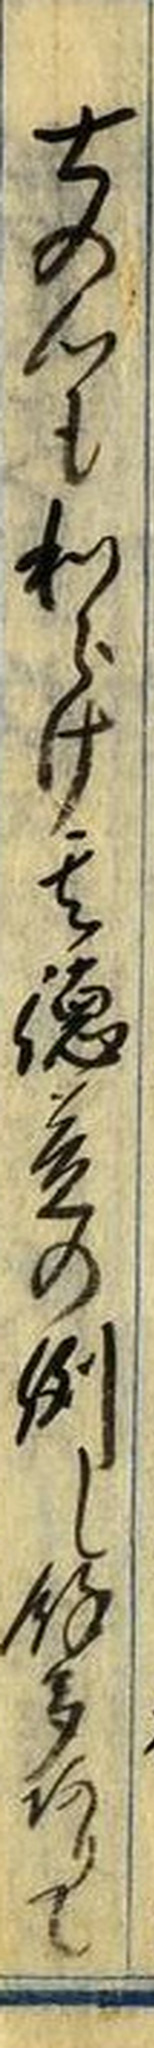士の心も和らけ其徳益の例之余多ありて
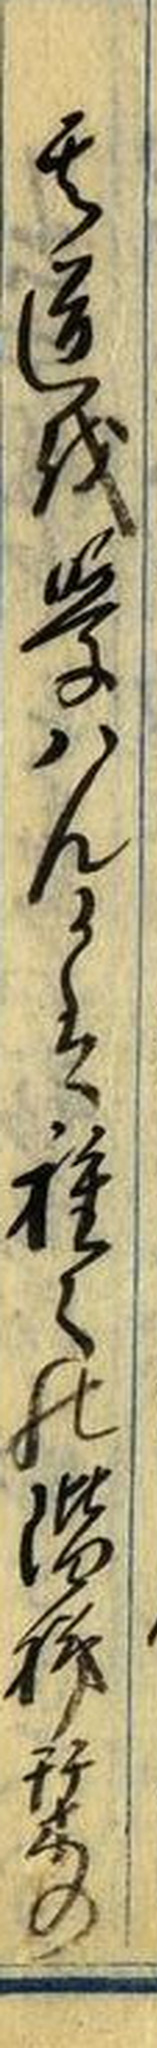其道を学ハんには種々の階梯栞の
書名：温古集 三巻
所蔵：福井県文書館 Fukui Prefectural Archives
